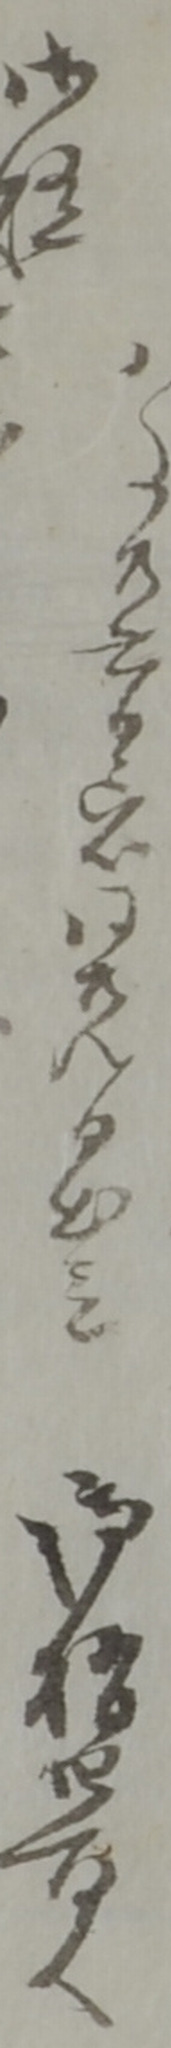八月廿六日着同廿八日出立御賄四百文
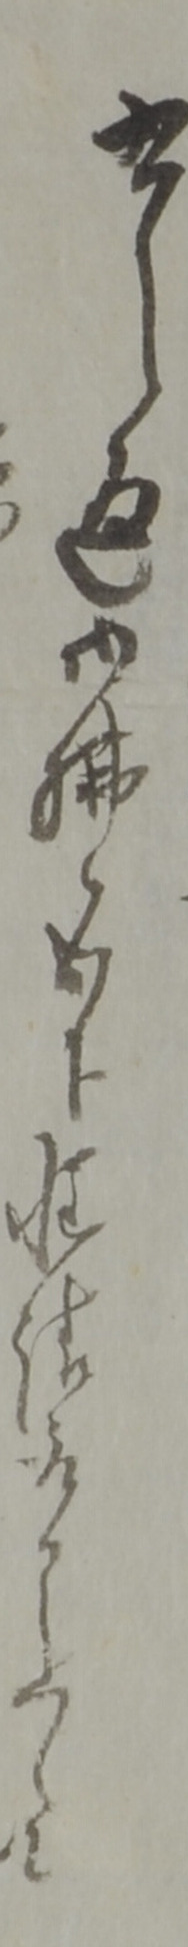右之通御払被成下慥請被申上候以上
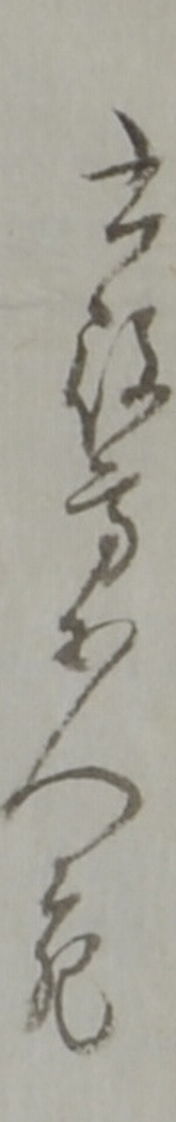書役方五人宛
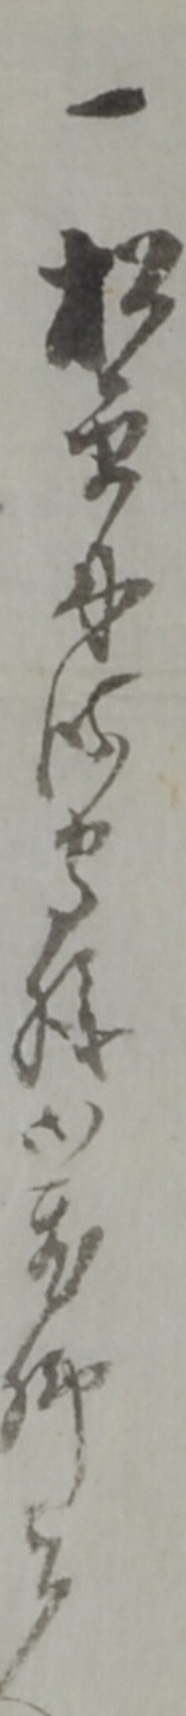一松平丹波守様御飛脚壱人

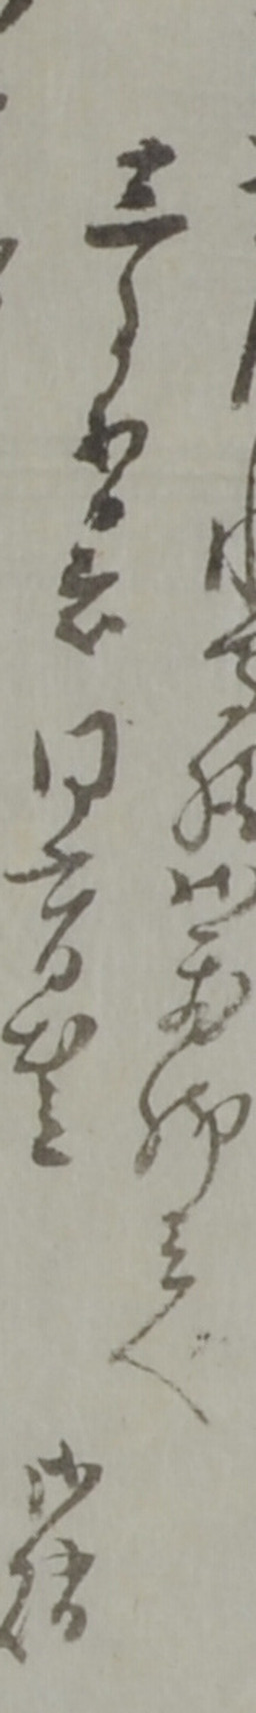十二月五日着同六日出立昼壱度
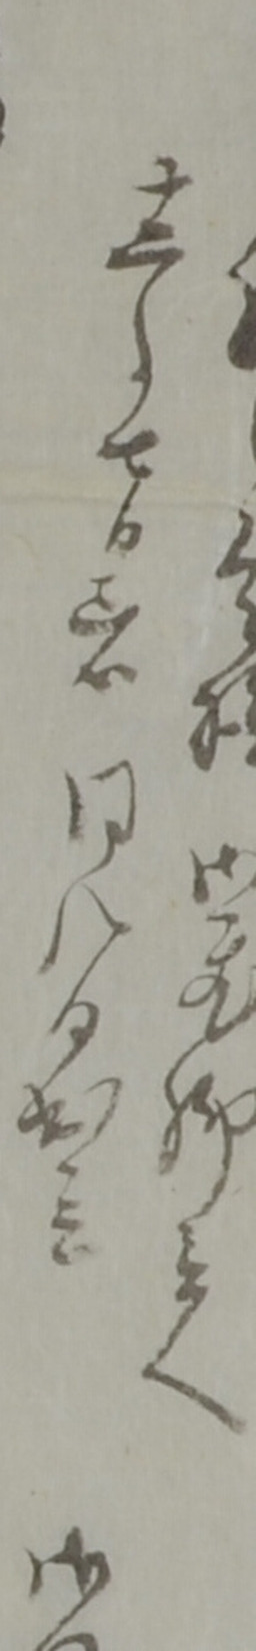十二月七日着同八日出立昼壱度
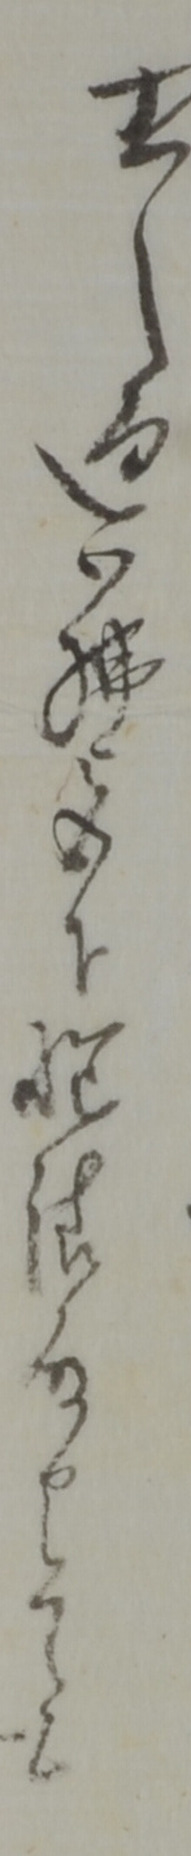右之通御払被成下慥受被申上候以上
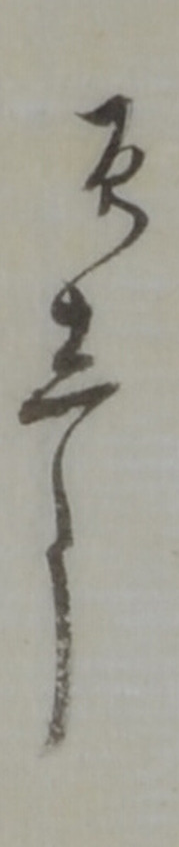辰十二月
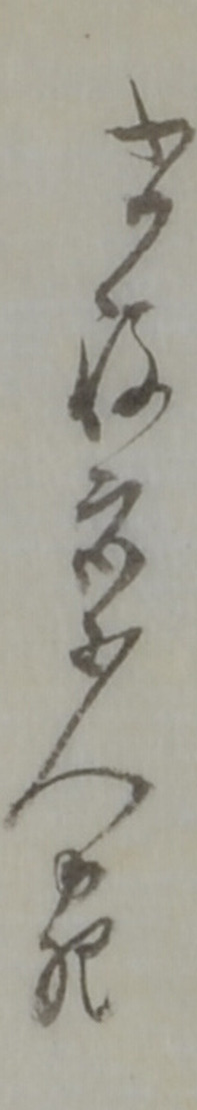書役衆五人宛
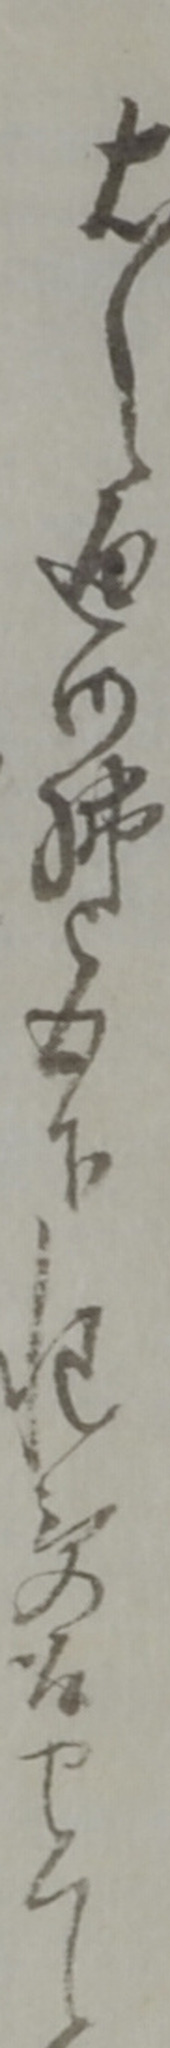右之通御払被成下慥受被申上候以上
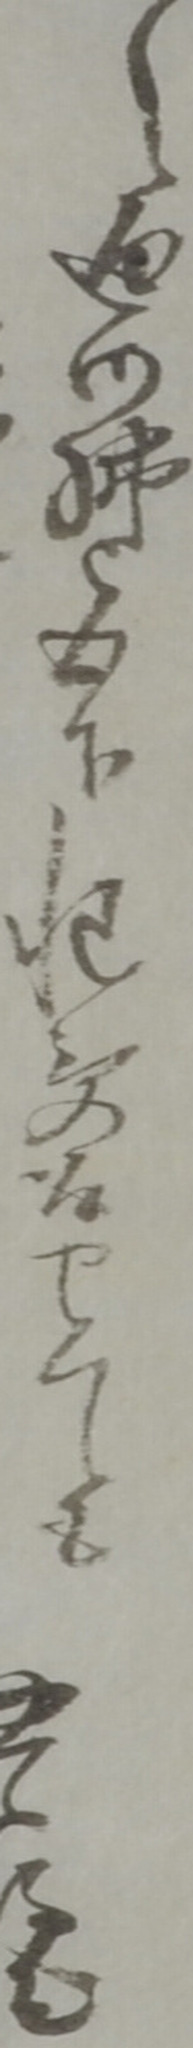右之通御払被成下慥受被申上候以上
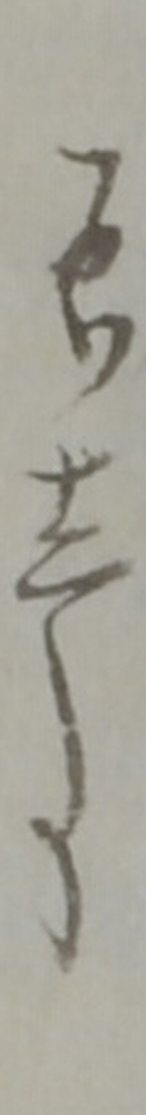辰十二月
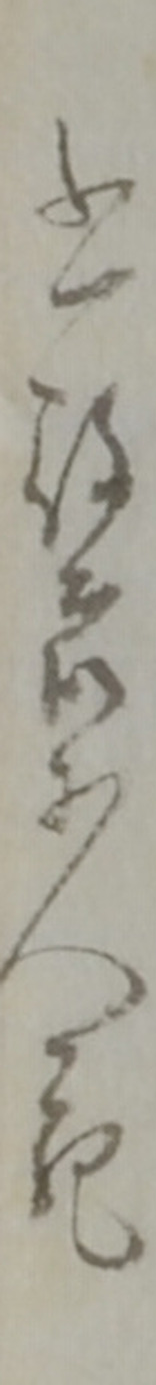書役衆五人宛

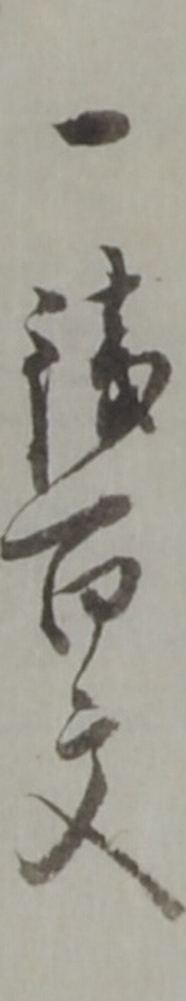一銭百文
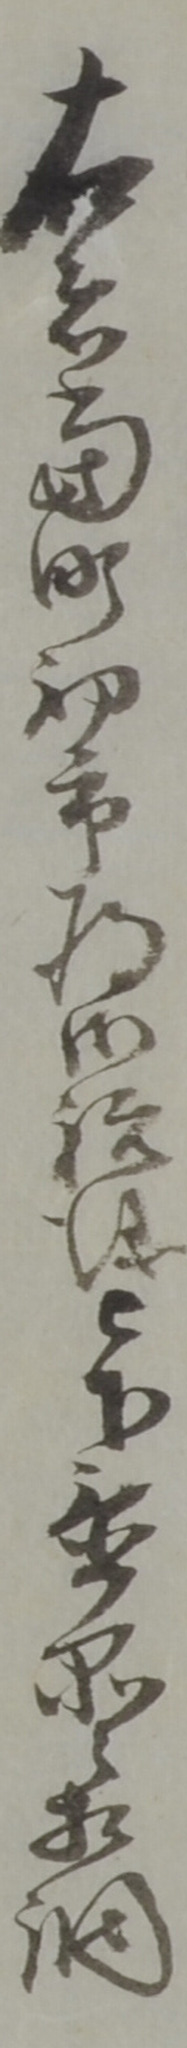右者当町初市為御祝儀被下置品々相調
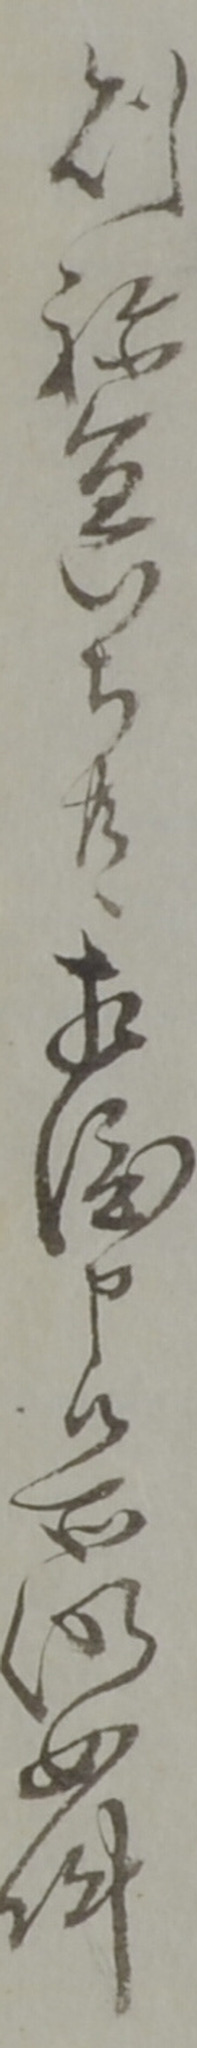則祢宜いち共へ相渡申候所仍如件
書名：諸願書控簿
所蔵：伊那市立高遠町図書館・合同会社AMANE
